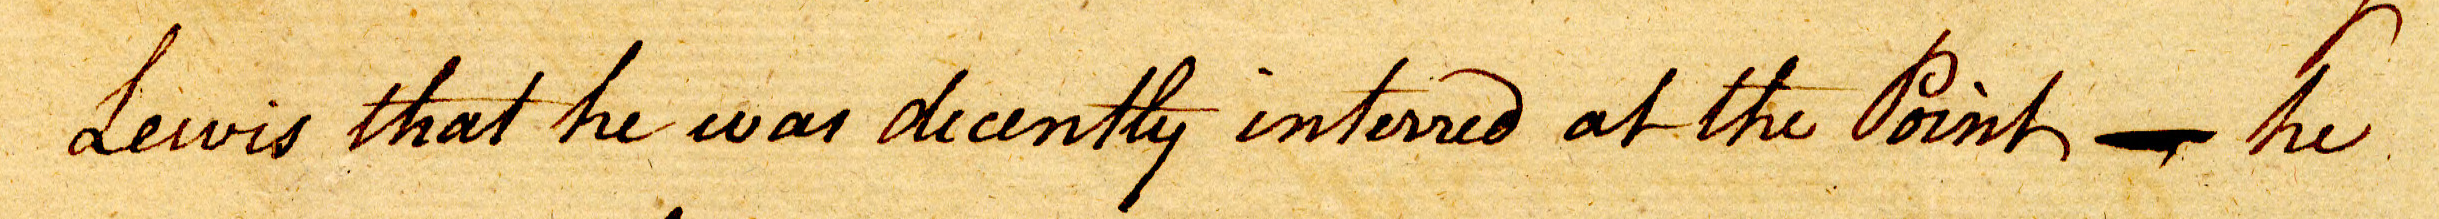Lewis that he was decently interred at the Point- he
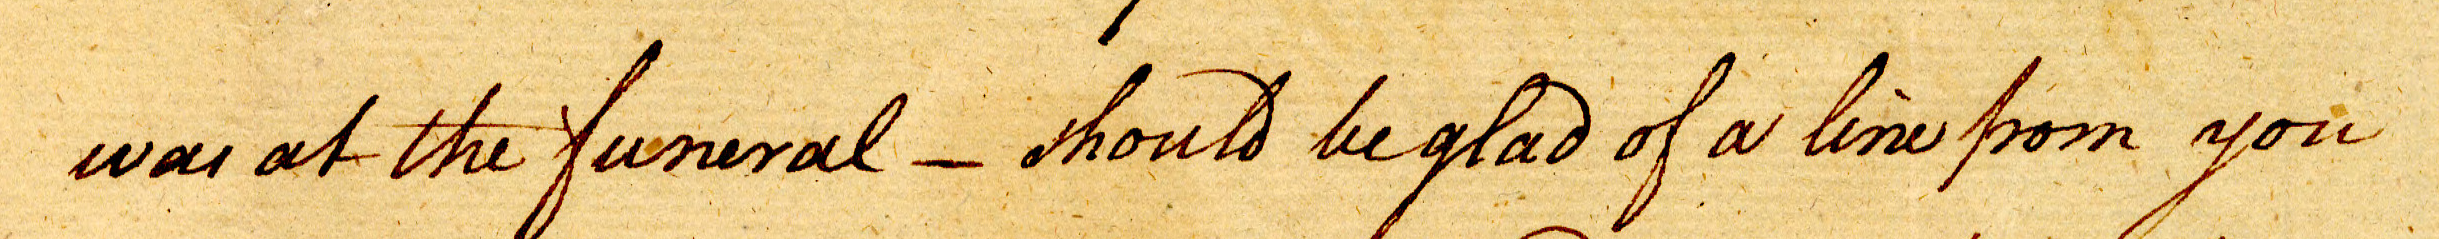was at the funeral- should be glad of a line from you
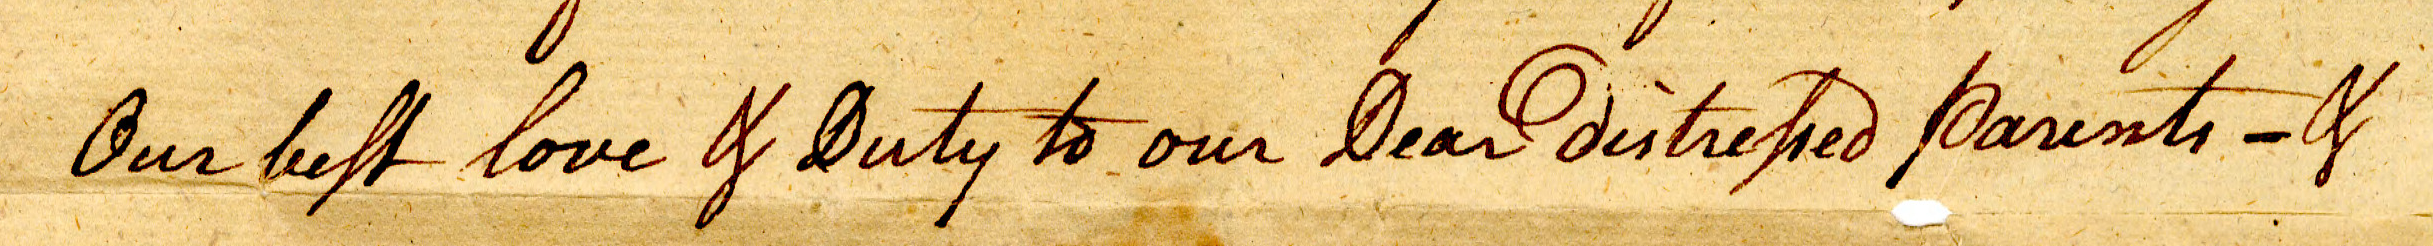Our best love & Duty to our Dear distressed parents- &
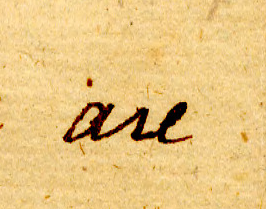are
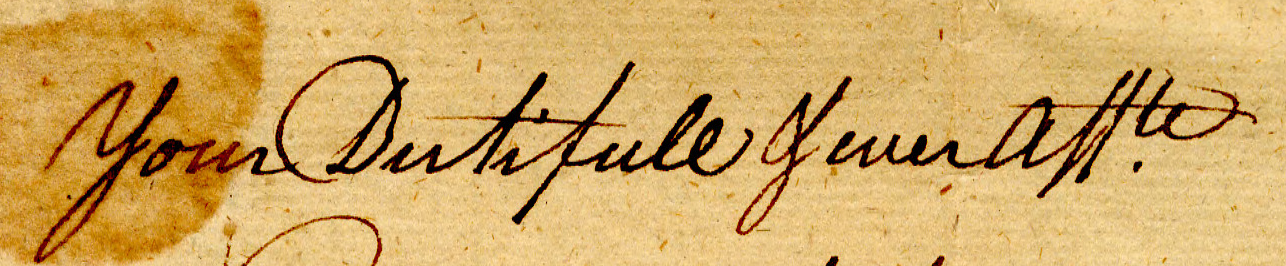Your Dutifull & ever Aff.^te
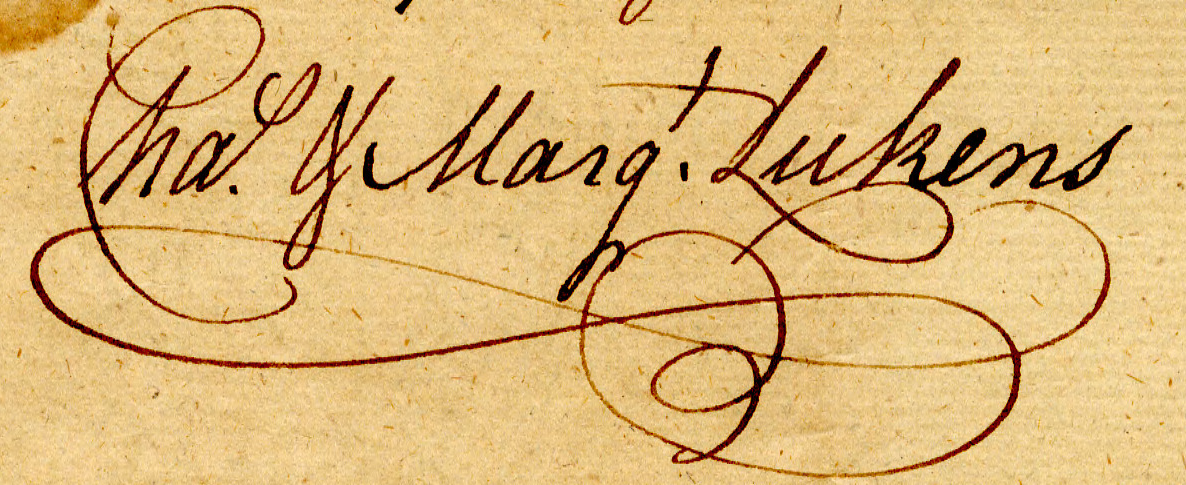Cha.^s and Marg.^t Lukens
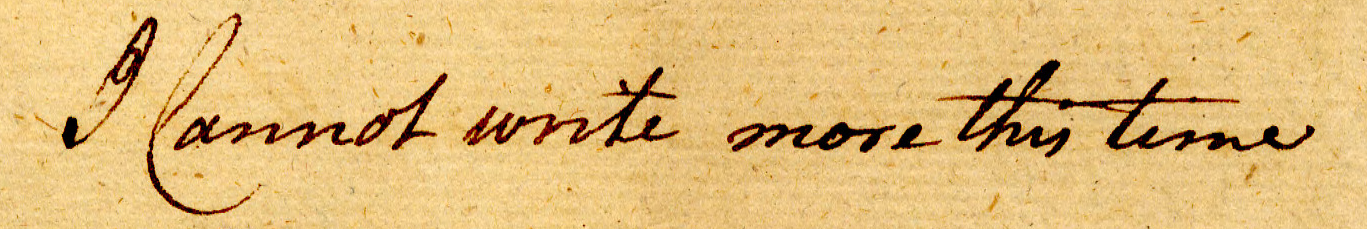I Cannot write more this time
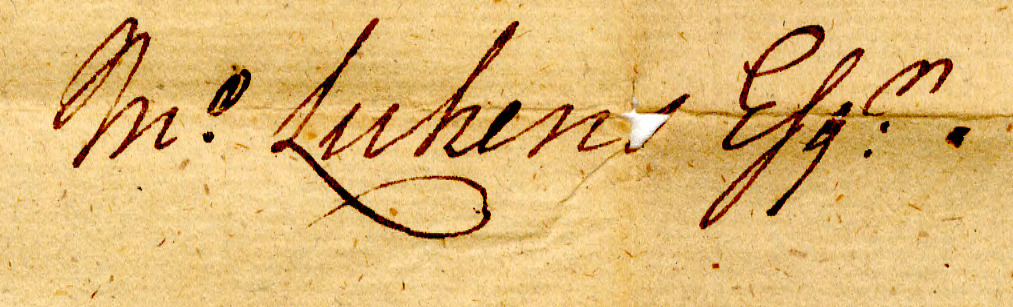M^r. Lukens Esq^r:.
